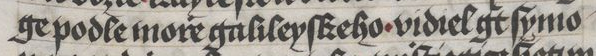ge podle moṙe glileyſkeho.vidiel ḡt ſymo¬
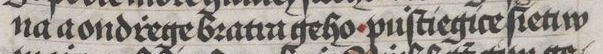na a ondṙege bratra geho.puẛtiegíce ſieti w
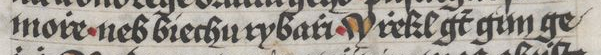moṙe neb bíechu rybaṙi.Y ṙekl ḡt gím ge¬
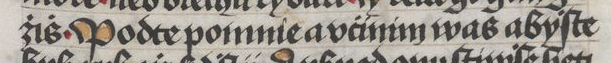żiṡ.Podte po mnie a vċinim was abyẛte
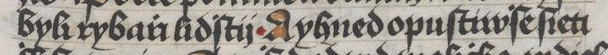byli rybaṙi lidẛti .A yhned opuſtiwẛe ſieti
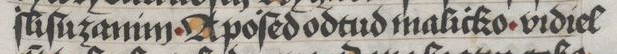ẛliſu za nim. A poẛed odtud maliċko.vidiel
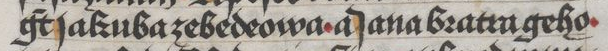ḡt Iakuba zebedeowa.a Iana bratra geho.
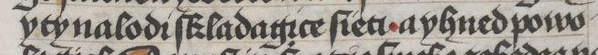y ty na lodi ſkladagíce ſíeti.a yhned powo¬
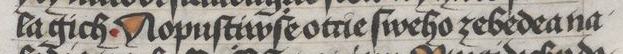la gich.A opuſtiwẛe otcie ſweho zebedea na¬
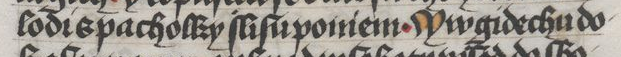lodi s pachoſky ẛli ſu po niem.Y wgídechu do¬
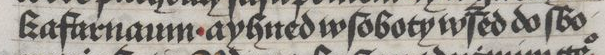kafanaum.a yhned w ſoboty wſed do ſbo¬
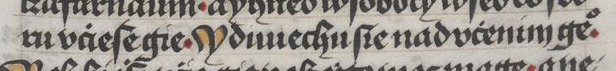ru vċieſe gie.Y diuiechu ſe nad vċenim geo
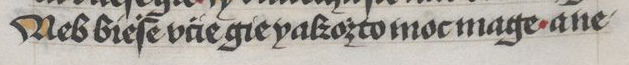Neb bíeẛe vċie gie yakożto moc mage.ane¬
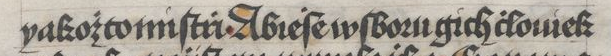yakożto miſtṙi. A bíeẛe w ſbozu gich ċloviek
